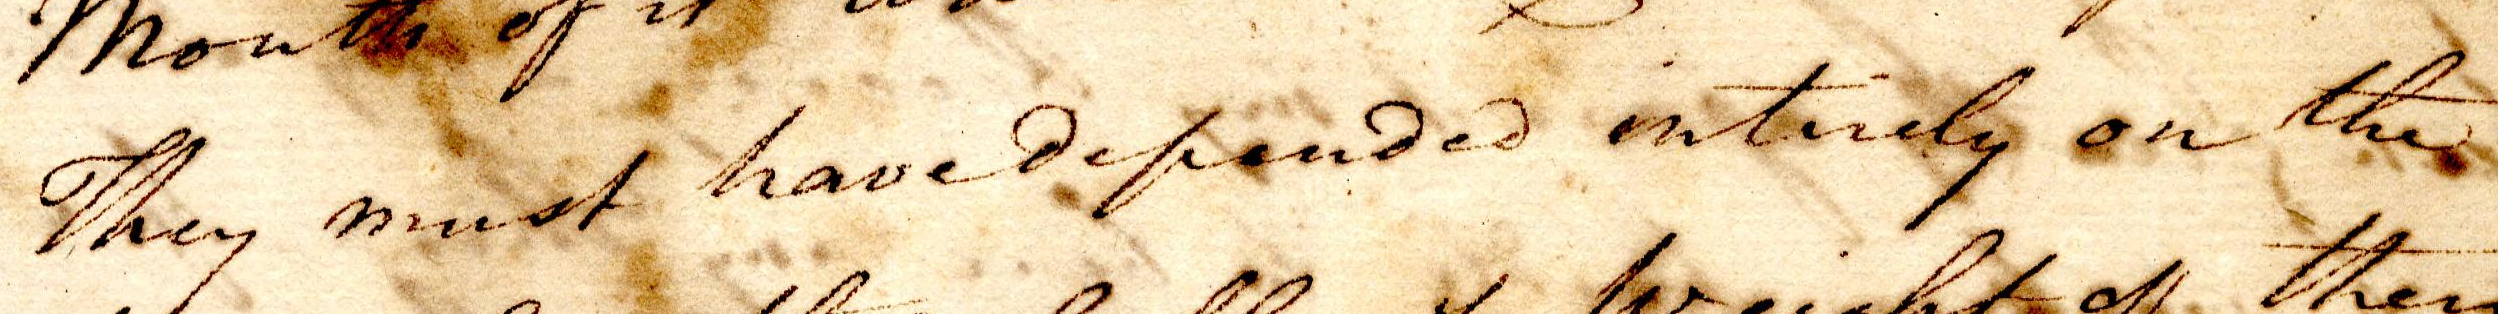They must have depended intirely on the
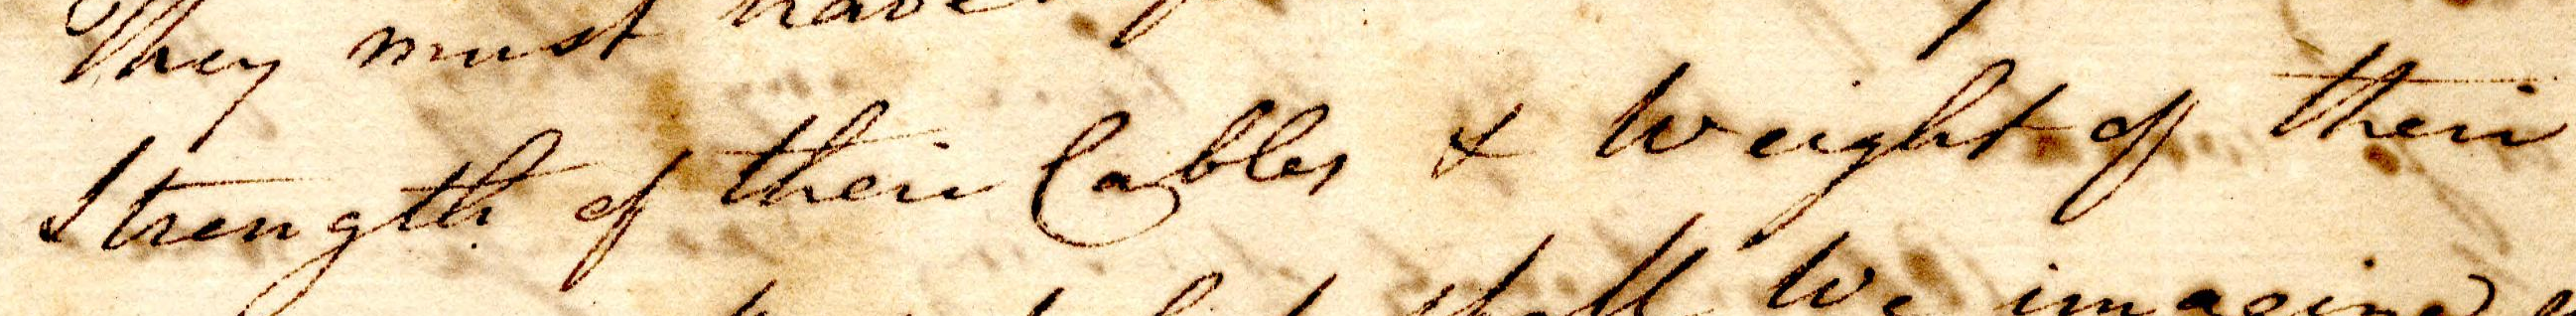Strength of their Cables & Weight of their
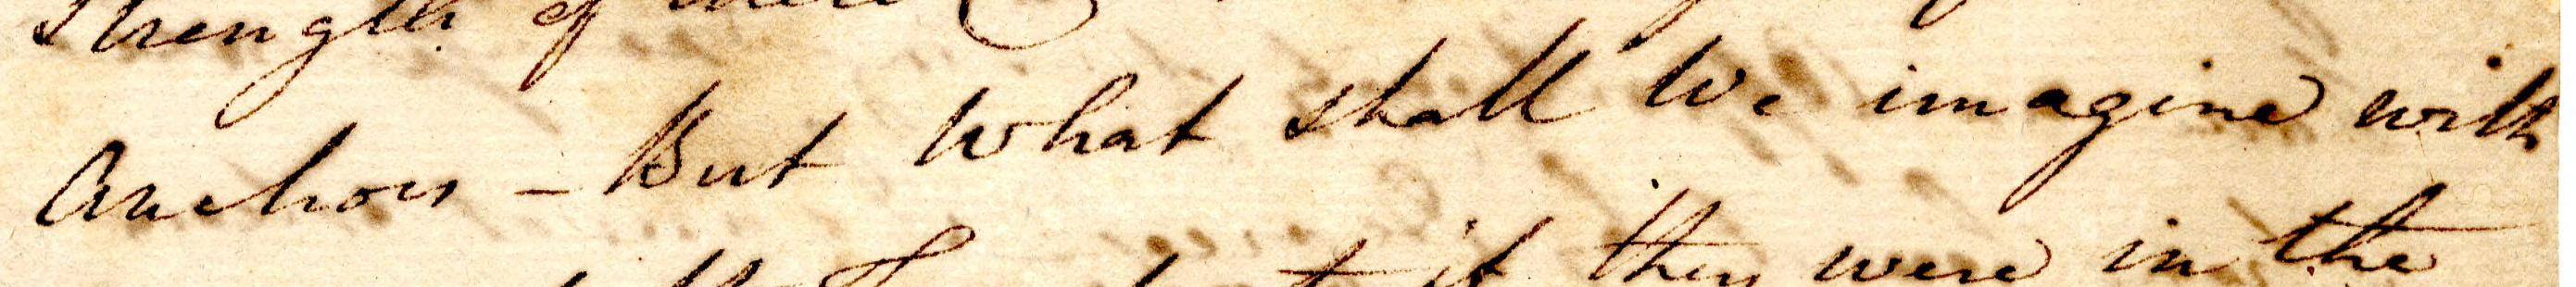Anchors- But what shall we imagine with
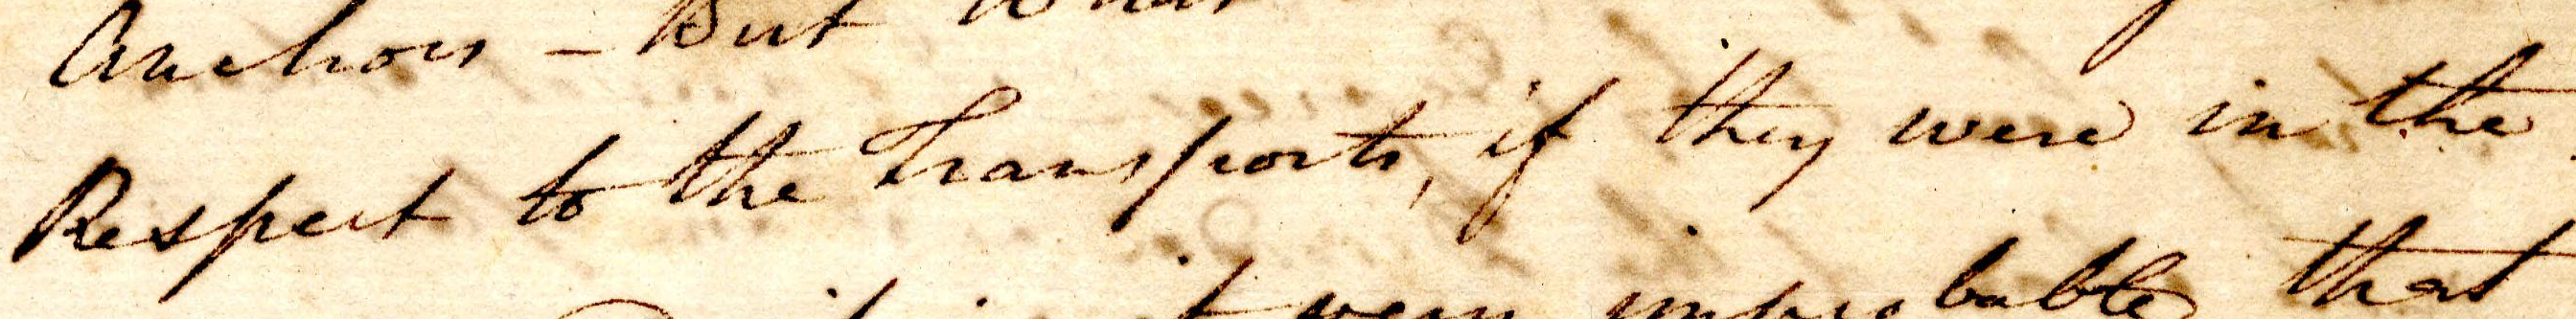Respect to the Transports, if they were in the
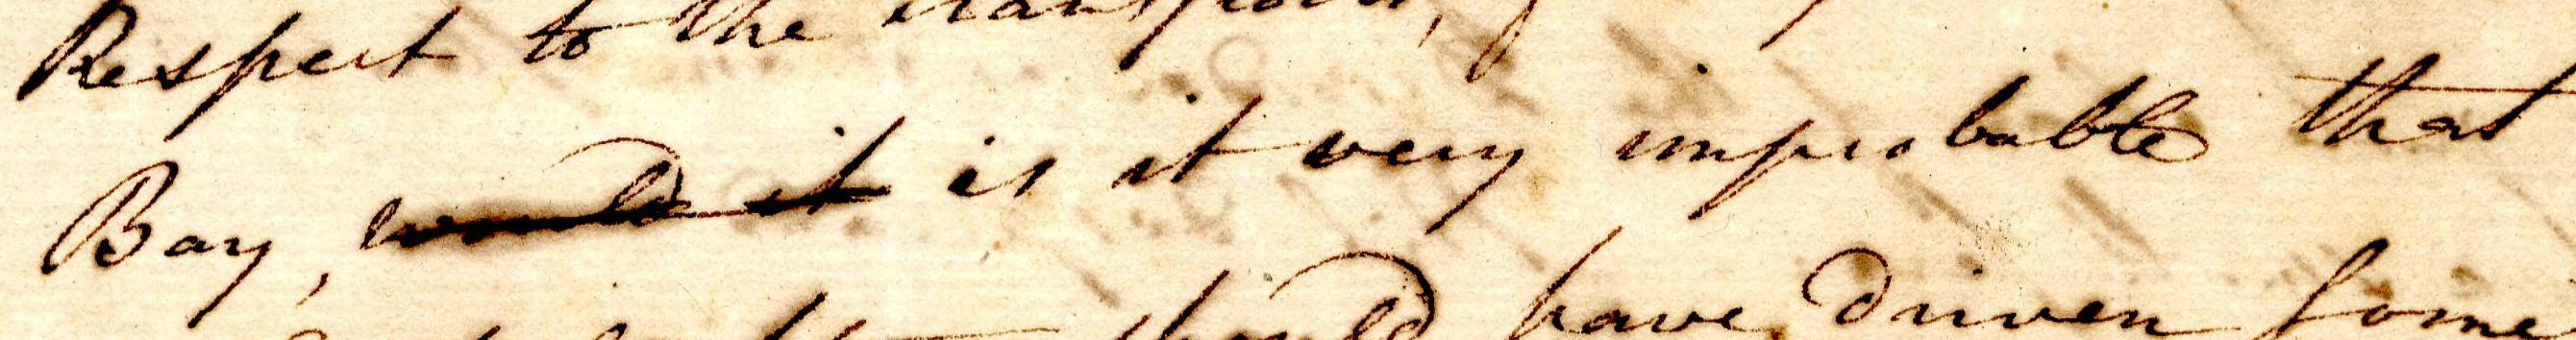Bay, would it is it very improbable that
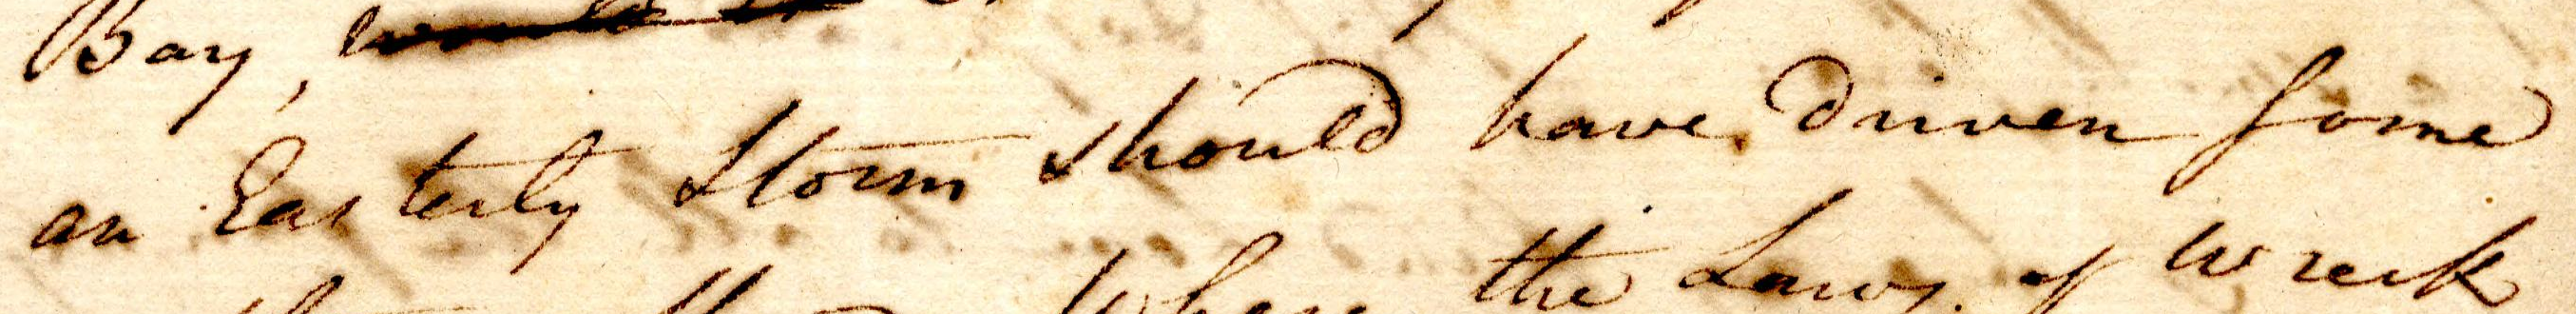an Easterly Storm should have driven some
